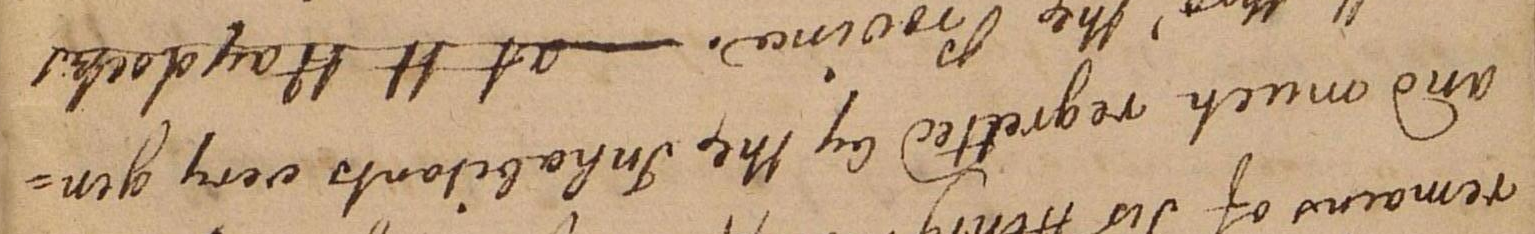and much regretted by the Inhabitants very gen-
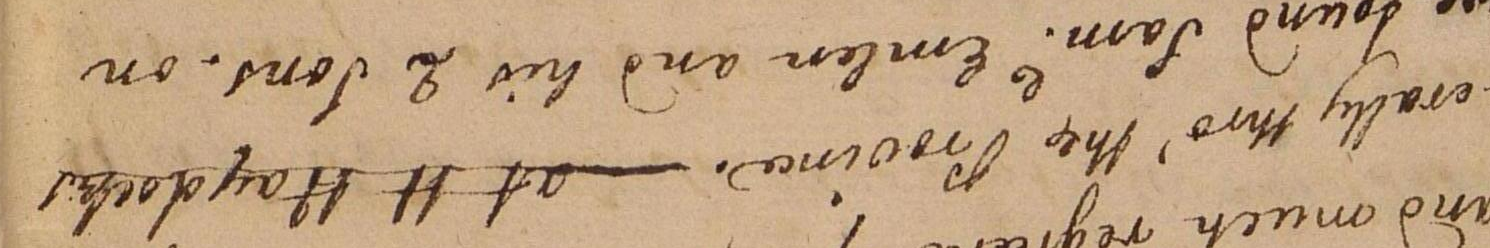-erally thro' the Province. - at H Haydocks
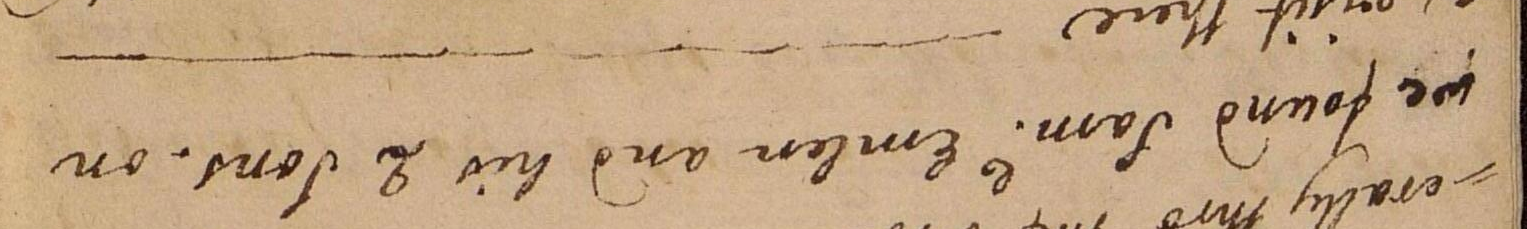we found Sam^l. Emlen and his 2 Sons. on
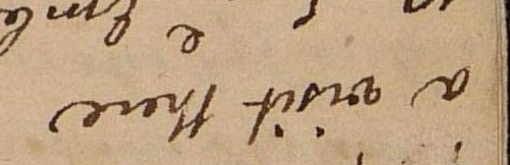a visit there
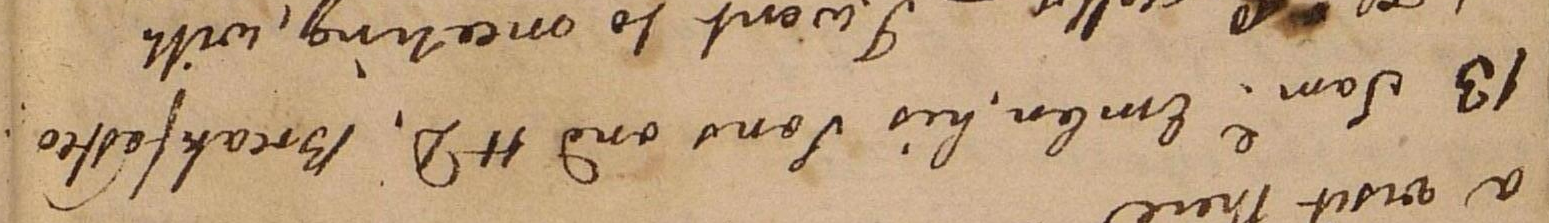13 Sam^l. Emlen, his Sons and HD, Breakfasted
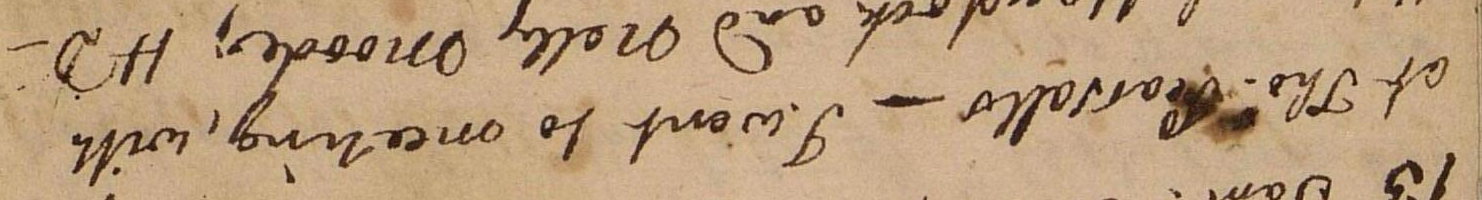at Tho^s. Pearsalls - I went to meeting, with
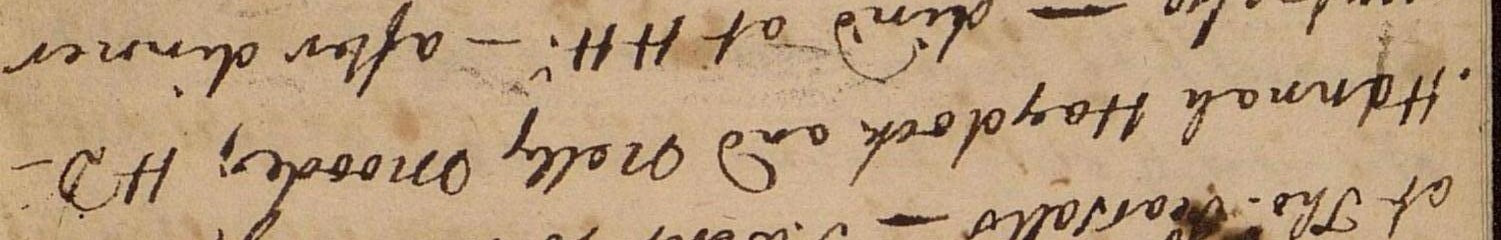Hannah Haydock and Nelly Moode, HD-
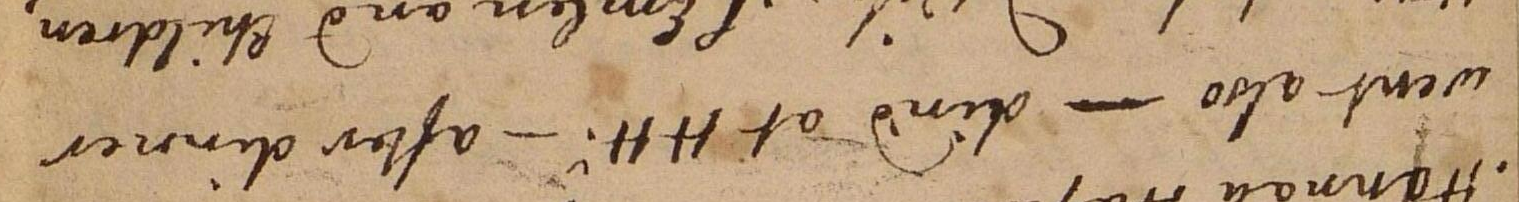went also - din'd at HH^s. - after dinner
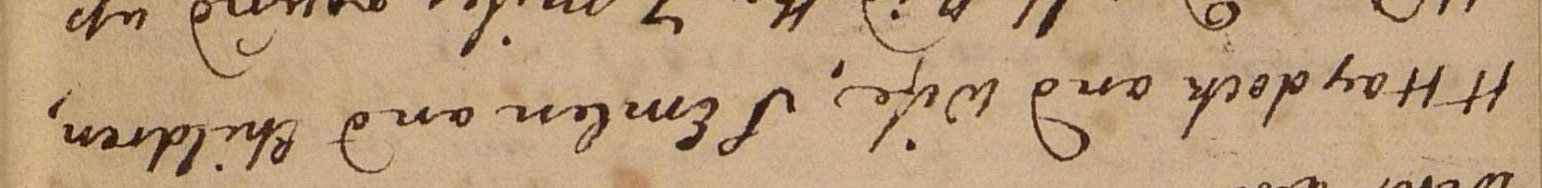H Haydock and Wife, S Emlen and Children,
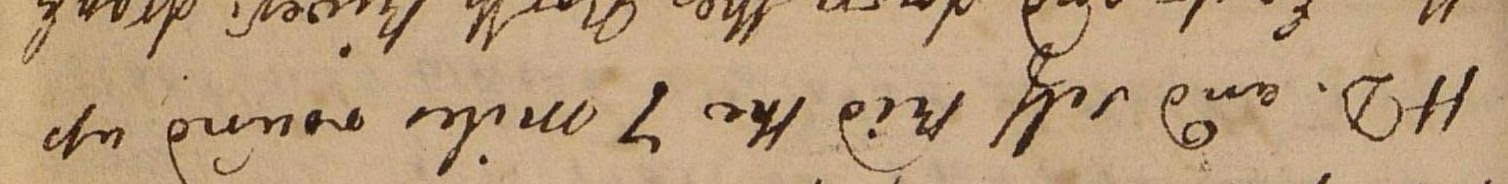HD. and self Rid the 7 Miles round up
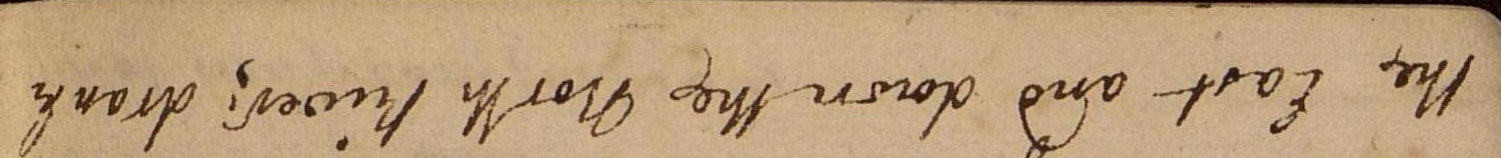the East and down the North River; drank
